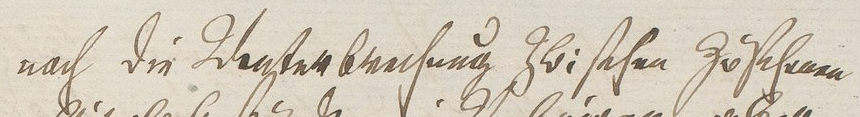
noch die Unterbrechung zwischen Göschenen
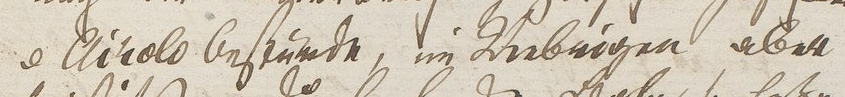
& Airolo bestünde, im Uebrigen aber
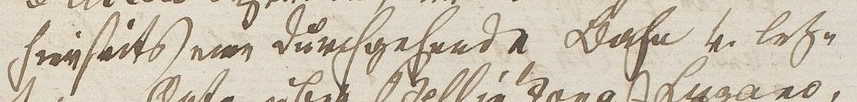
hierseits eine durchgehende Bahn v. lez-
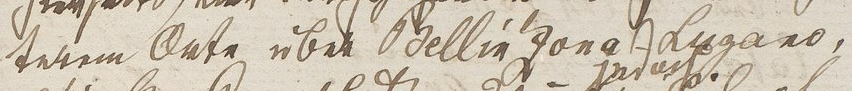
terem Orte über Bellinzona – Lugano
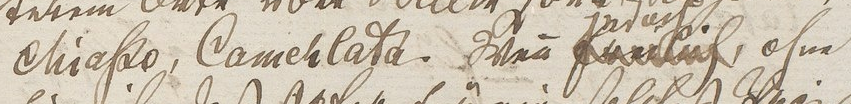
Chiasso , Camerlata. Wenn freilichjedoch, ohne
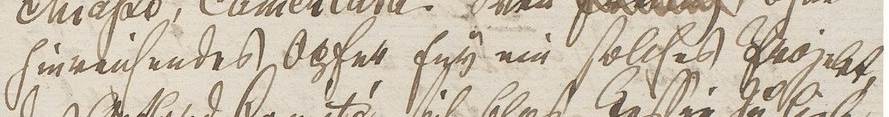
hinreichendes Opfer für ein solches Projekt,
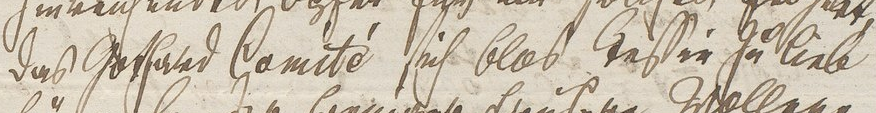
das Gothard Comité sich blos Tessin zu lieb
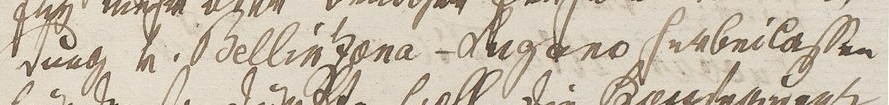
dung v. Bellinzona – Lugano herbeilassen
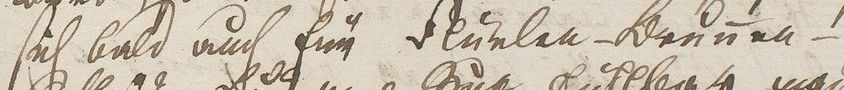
sich bald auch für Flüelen–Brunnen–
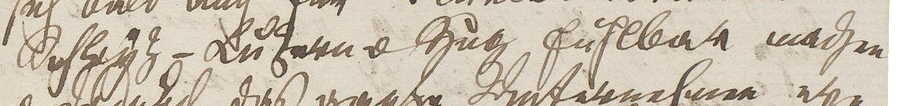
Schwyz–Luzern & Zug fühlbar machen
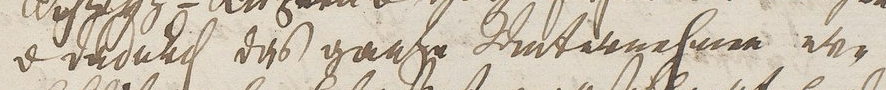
& dadurch das ganze Unternehmen er-
